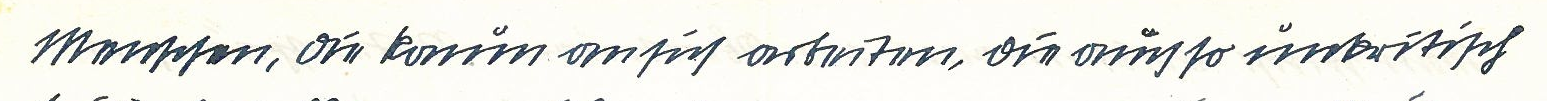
Menschen, die kaum an sich arbeiten, die auch so unkritisch
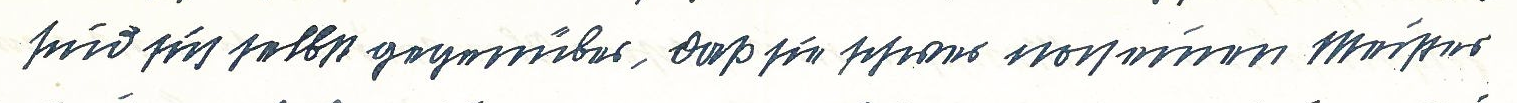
sind sich selbst gegenüber, daß sie schwer noch einen Meister
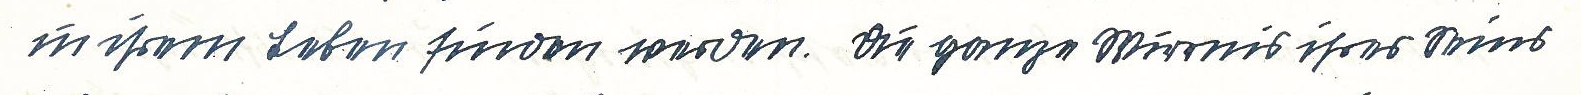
in ihrem Leben finden werden. Die ganze Wirrnis ihres Seins
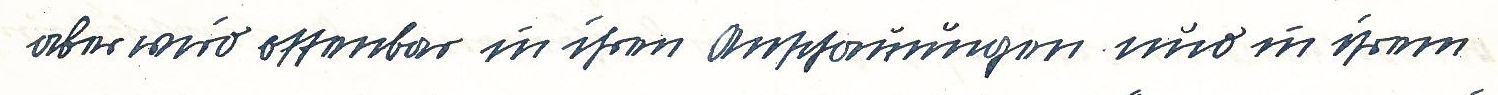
aber wird offenbar in ihren Anschauungen und ihrem
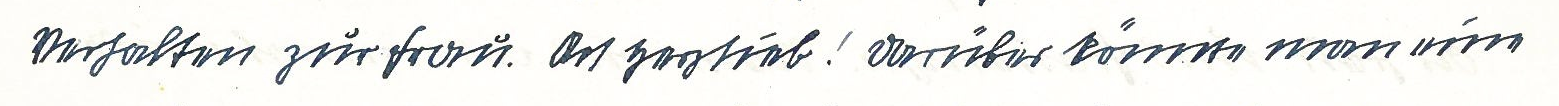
Verhalten zur Frau. Ach Herzlieb! Darüber könnte man eine
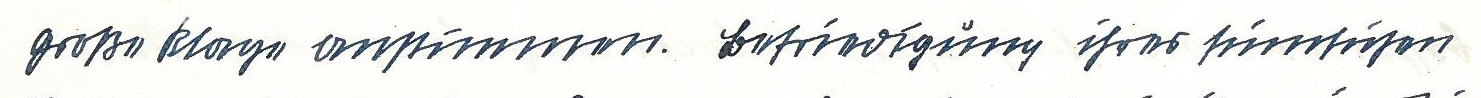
große Klage anstimmen. Befriedigung ihres sinnlichen
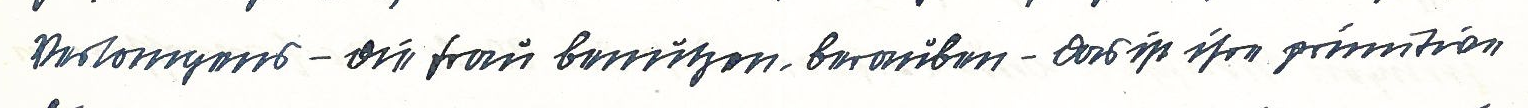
Verlangens – die Frau benutzen, berauben – das ist ihre primitive
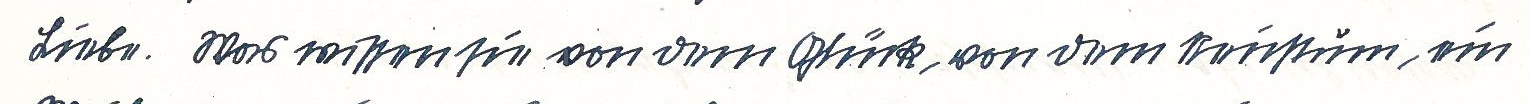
Liebe. Was wissen sie von dem Glück, von dem Reichtum, ein
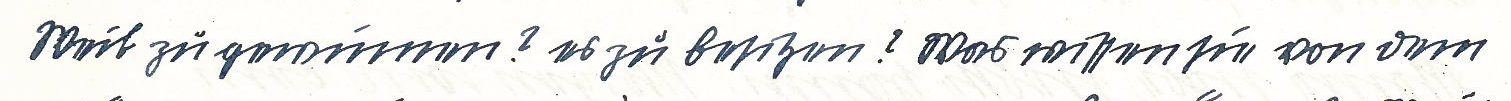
Weib zu gewinnen? es zu besitzen? Was wissen sie von dem
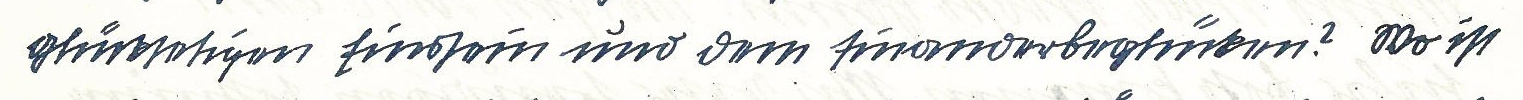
glückseligen Einssein und dem Einanderbeglücken? Wo ist
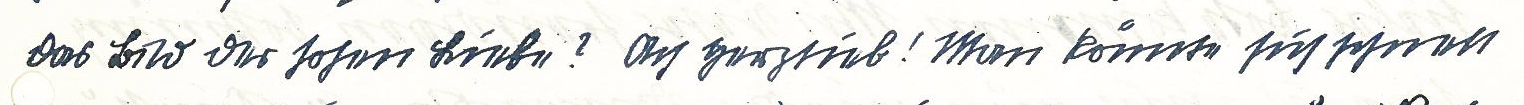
das Bild der hohen Liebe? Ach Herzlieb! Man könnte sich schnell
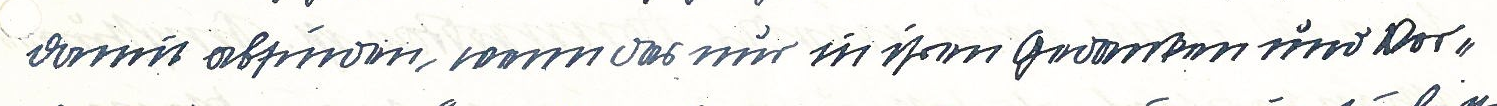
damit abfinden, wenn das nur in ihren Gedanken und Vor¬
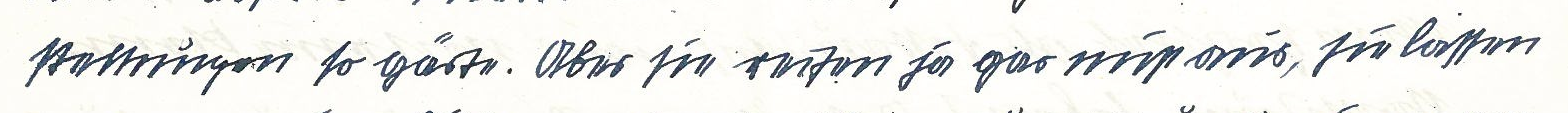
stellungen so gärte. Aber sie reifen ja gar nicht aus, sie lassen
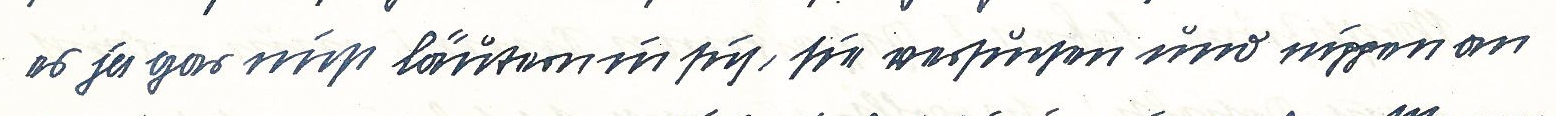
es ja gar nicht läutern in sich, sie versuchen und nippen an
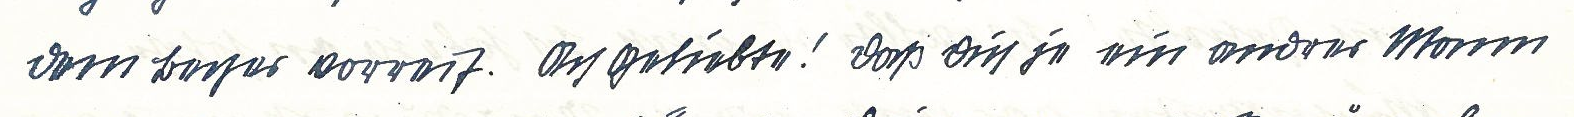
dem Laster vorreif. Ach Geliebte! Daß Dich ein andrer Mann
